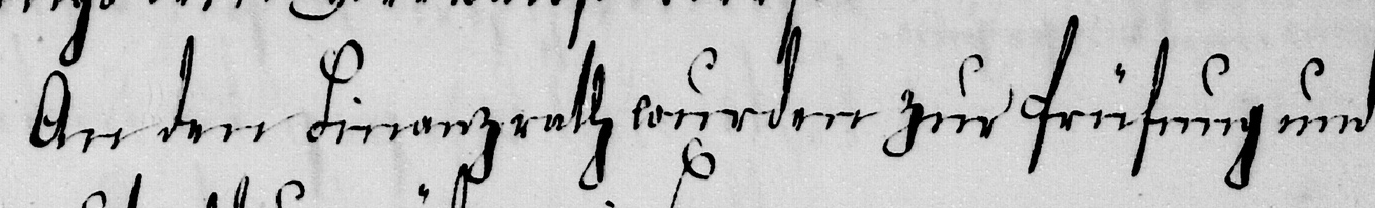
An den Finanzrath wurden zur Prüfung und
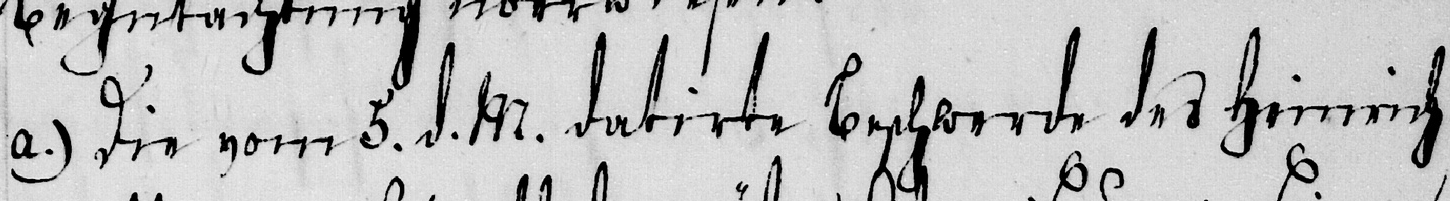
a.) Die vom 5. d. M. datirte Beschwerde des Heinrich
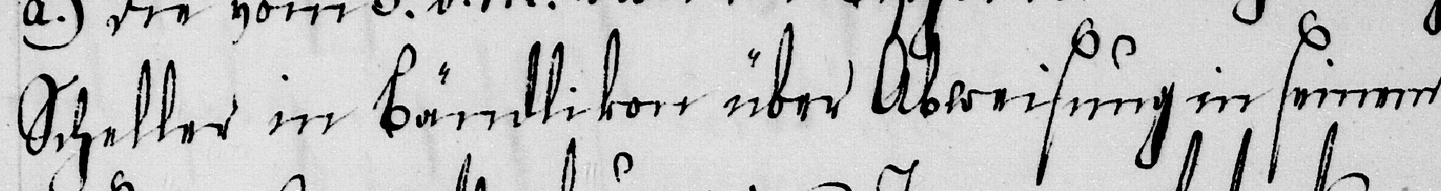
Scheller in Bändlikon über Abweisung in seinem
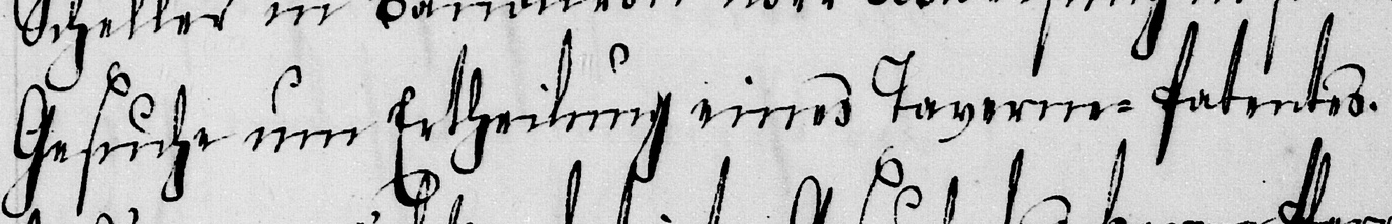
Gesuche um Ertheilung eines Taverne-Patentes.
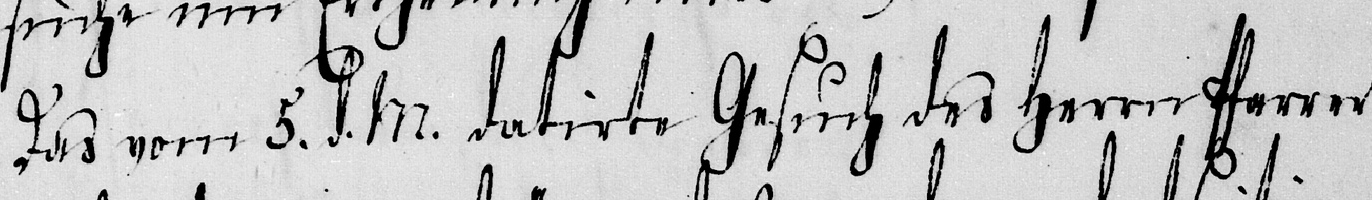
Das vom 5. d. M. datirte Gesuch des Herrn Pfarrer
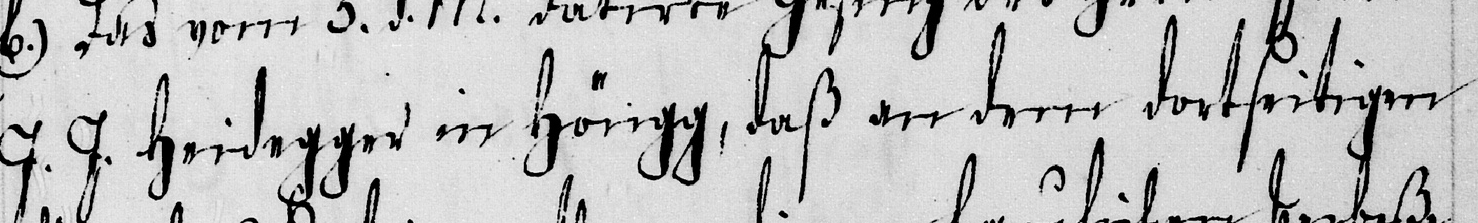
J. J. Heidegger in Höngg, daß an dem dortseitigen
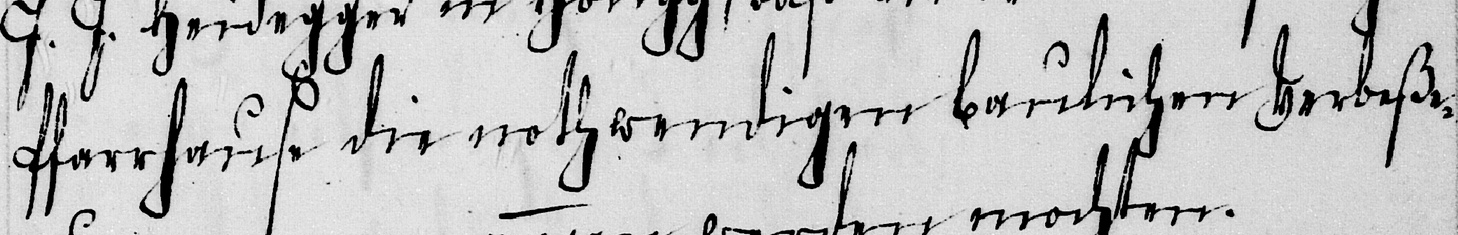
Pfarrhause die nothwendigen baulichen Verbeße¬
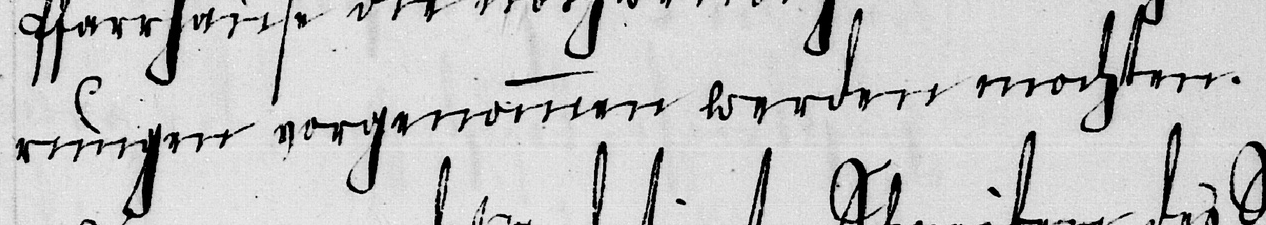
rungen vorgenommen werden mochten.
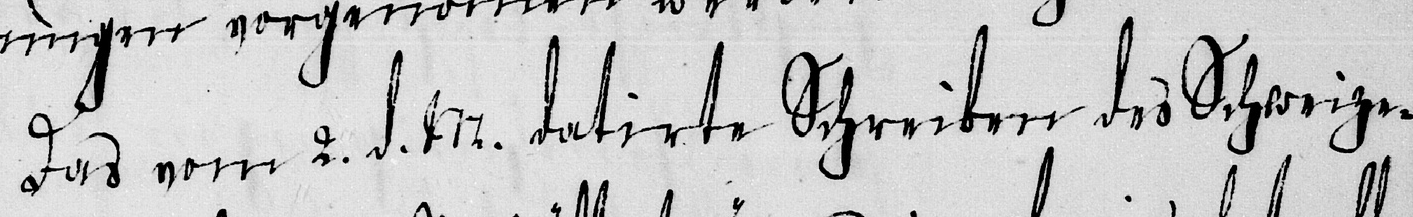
Das vom 2. d. M. datirte Schreiben des Schweize¬
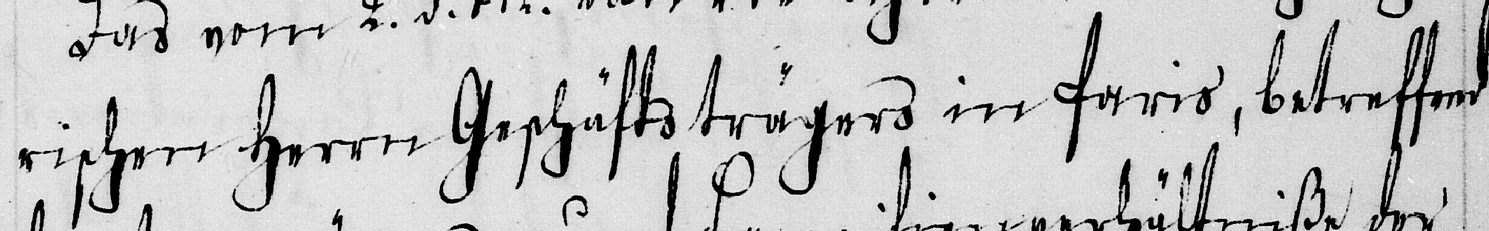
rischen Herrn Geschäftsträgers in Paris, betreffe¬
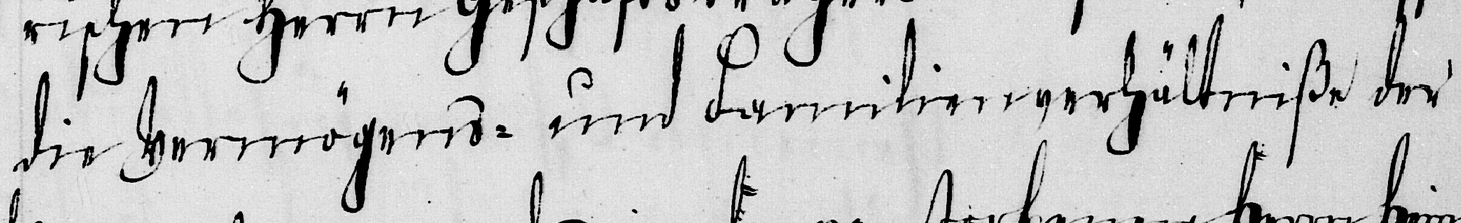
die Vermögens- und Familienverhältniße der
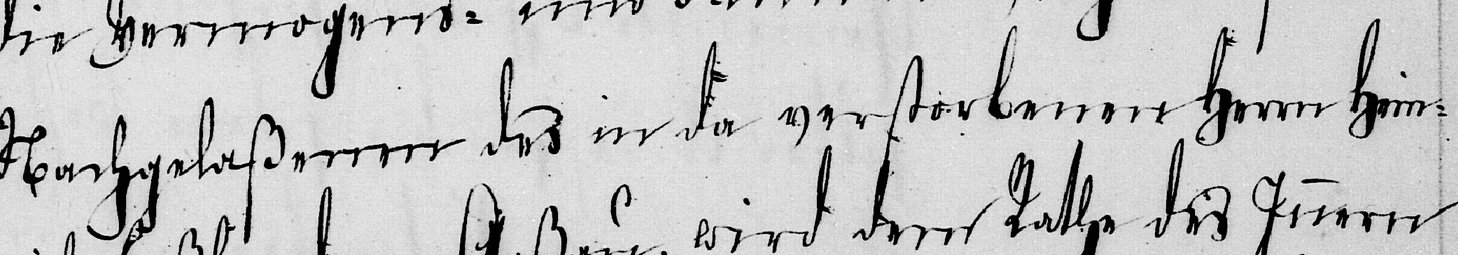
Nachgelaßenen des in da verstorbenen Herrn Hein¬
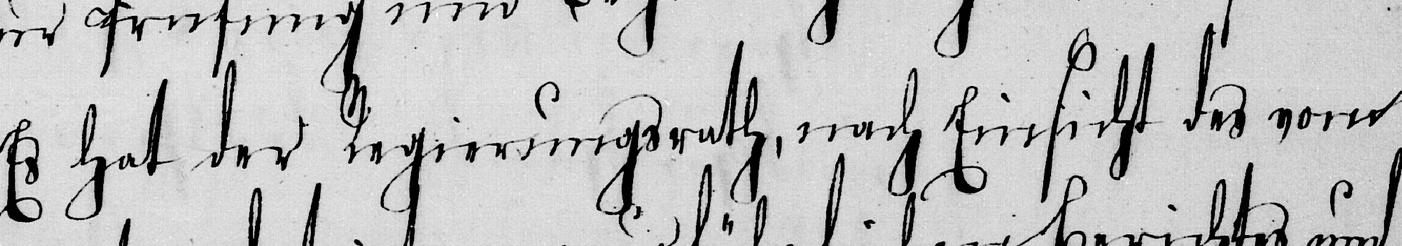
Es hat der Regierungsrath, nach Einsicht des vom
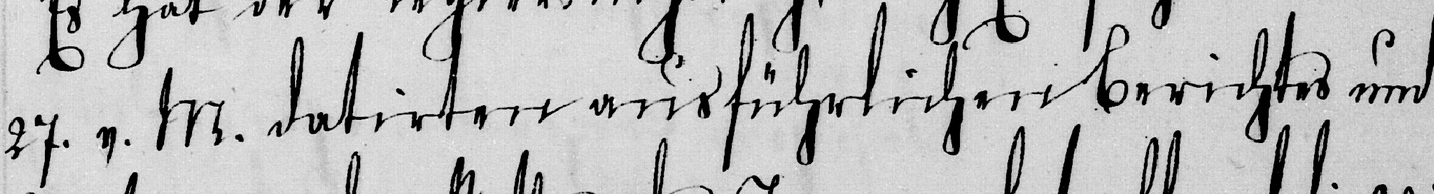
27. v. M. datirten ausführlichen Berichtes und
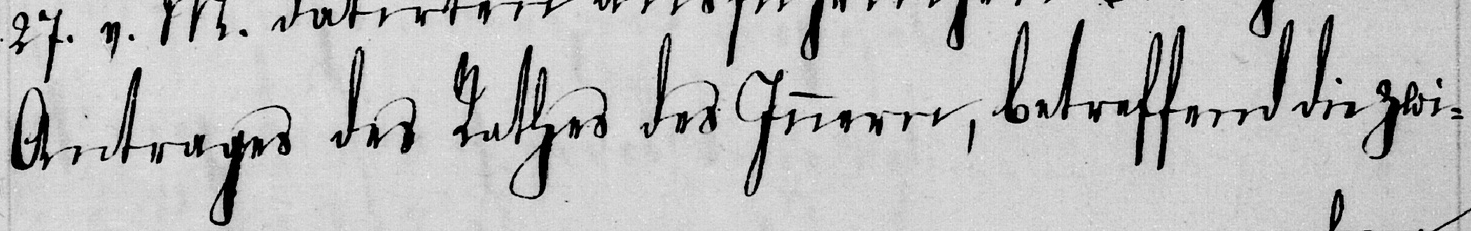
Antrags des Rathes des Innern, betreffend die
